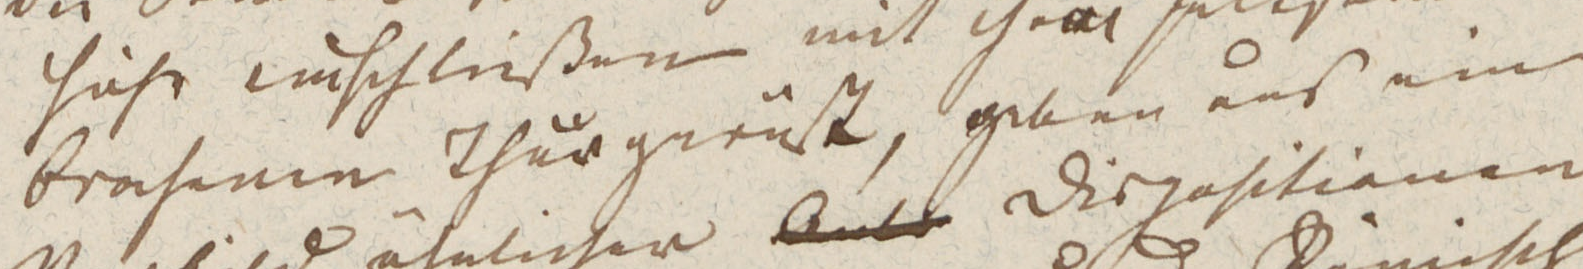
brochenen Thürgerüst, geben uns ein
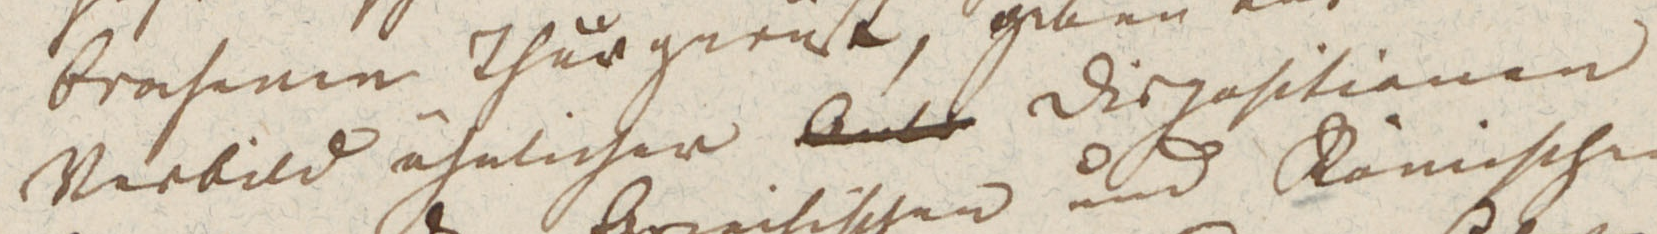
Vorbild ähnlicher An Dispositionen
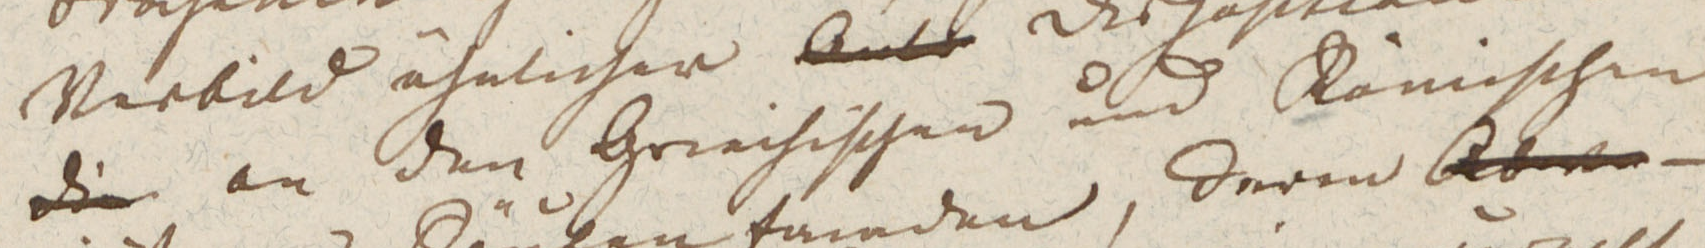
die an den Griechischen und Römischen
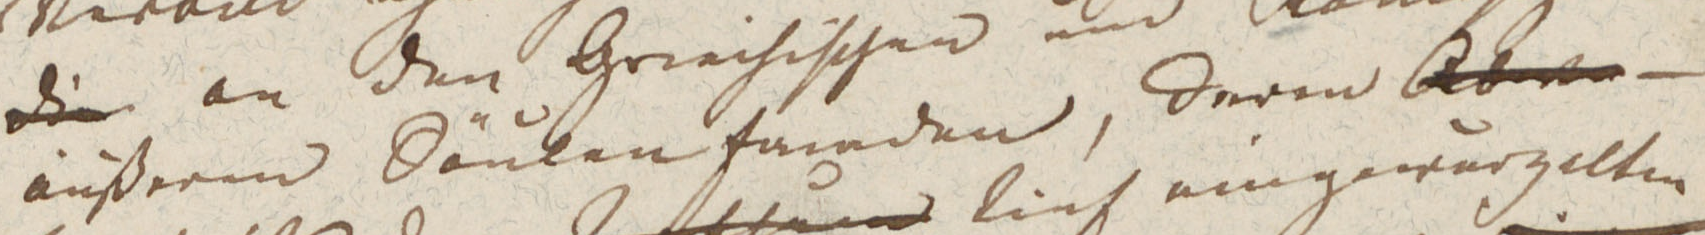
äusseren Säulenfacaden, deren Abwe-
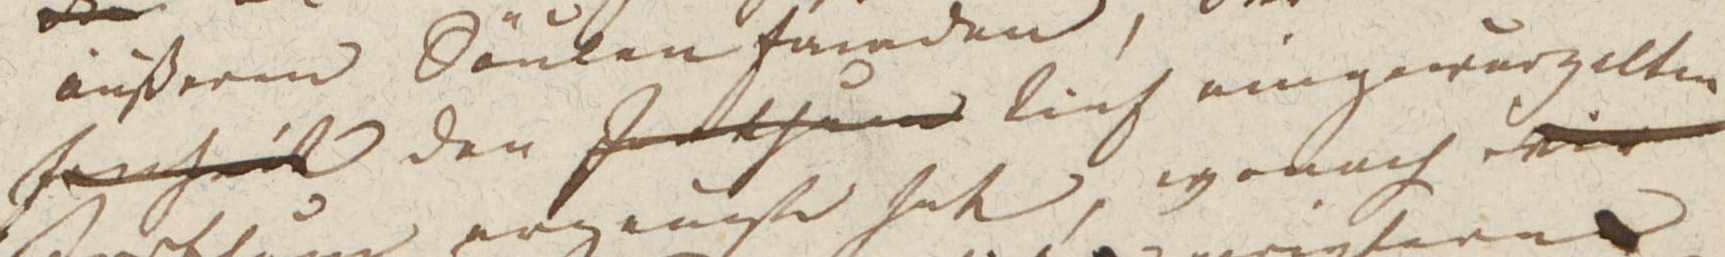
senheit den Irrthum tief eingewurzelten
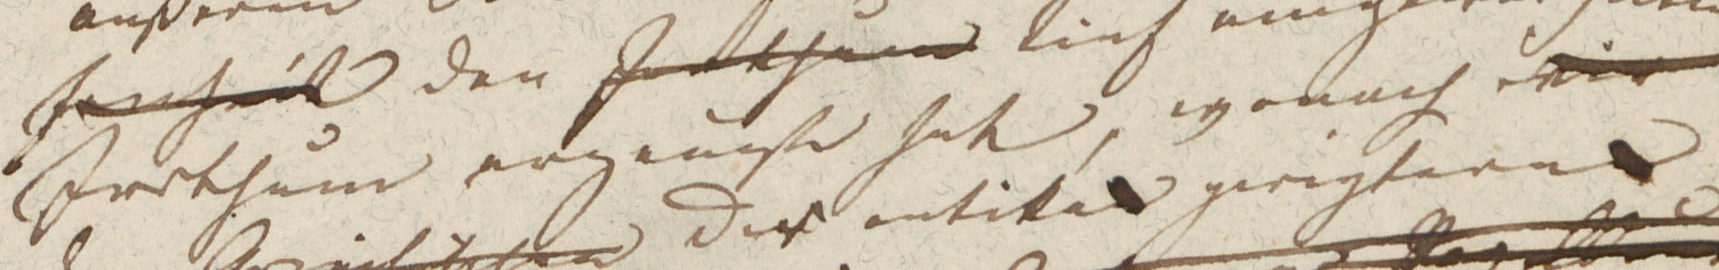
Irrthum erzeugt hat, wonach wir
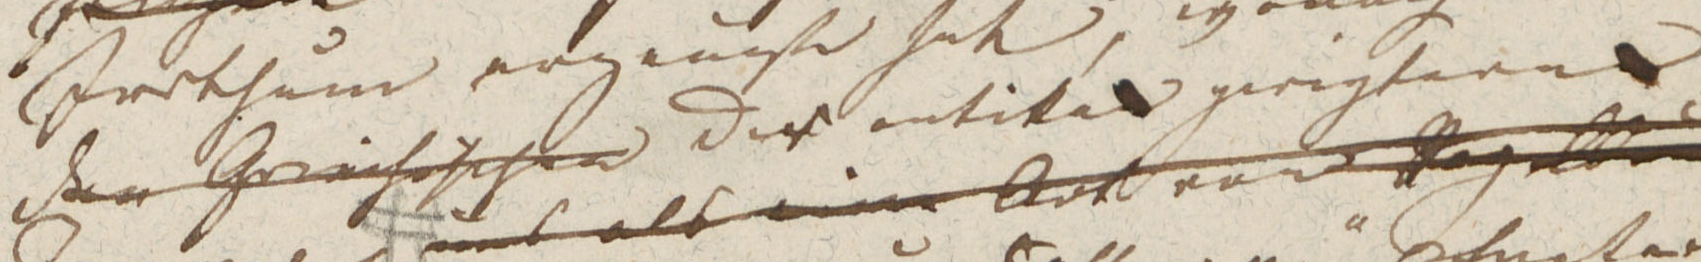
den Griechischen denr antiken peripteren
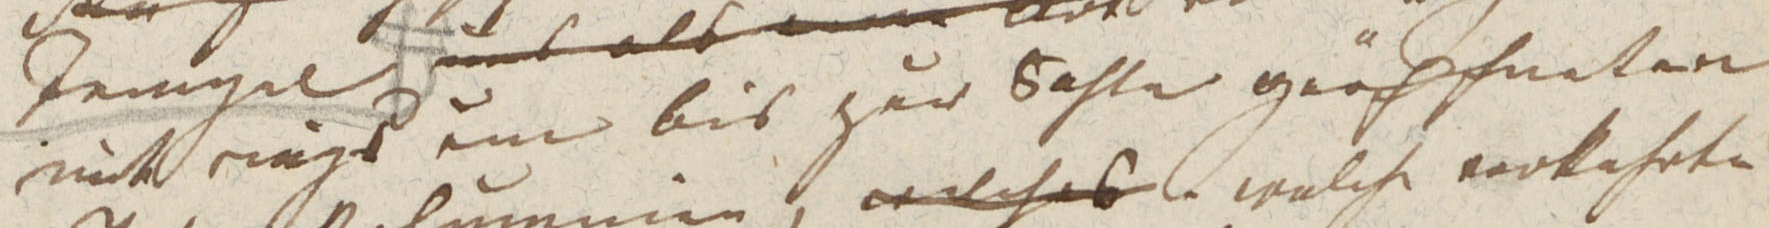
mit rings um bis zur Sohle geöffneten
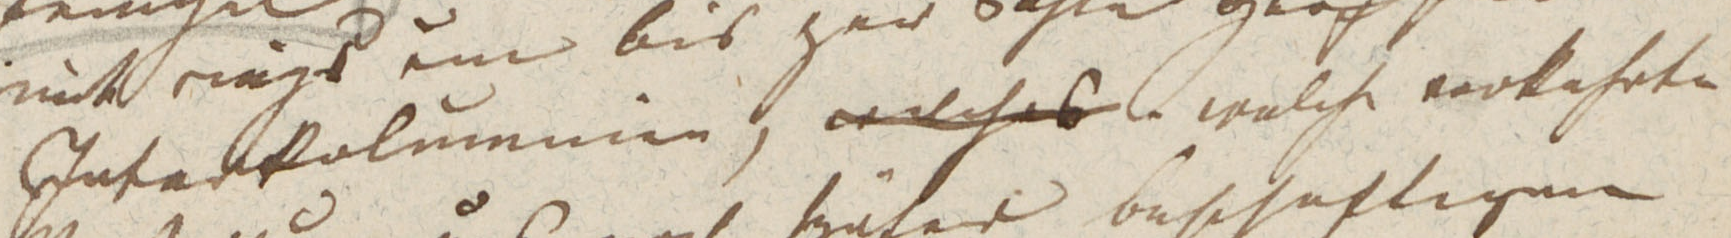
Intarkolumnien, welches welche verkehrte
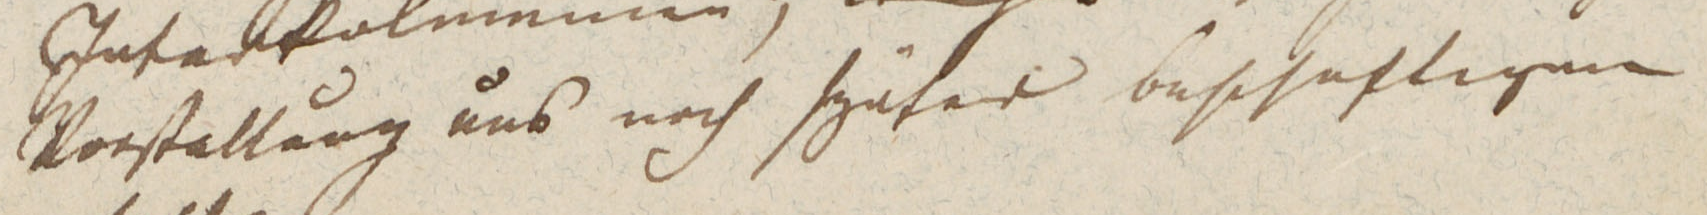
Vorstellung uns noch später beschaftigen
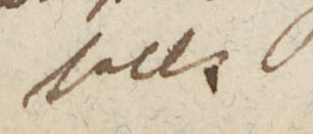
gestaltet,
